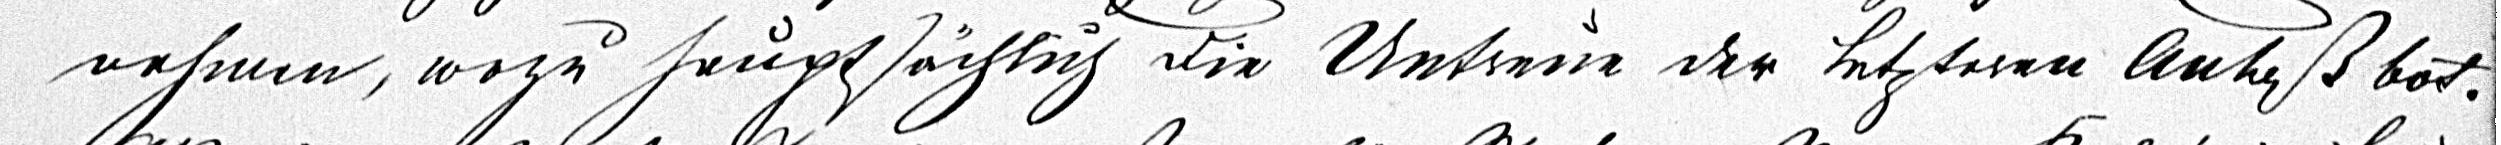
nahmen, wozu hauptsächlich die Untreue der letzteren Anlaß bot.
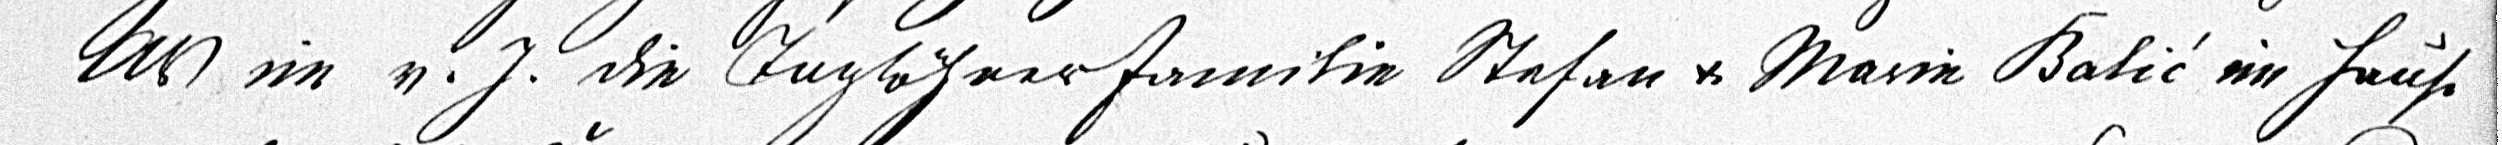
Als ein v. J. die Taglöhner Familie Stefan & Marie Balić ein Hause
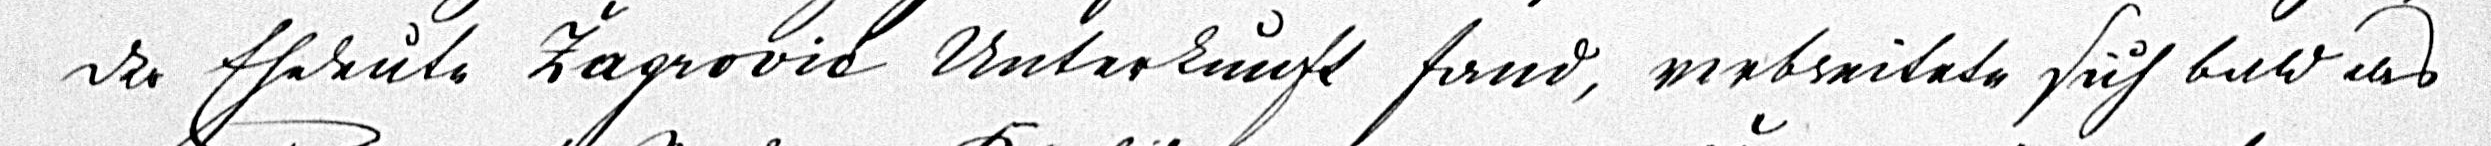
der Ehedeute Zagrović Unterkunft fand, verbreitete sich bald des
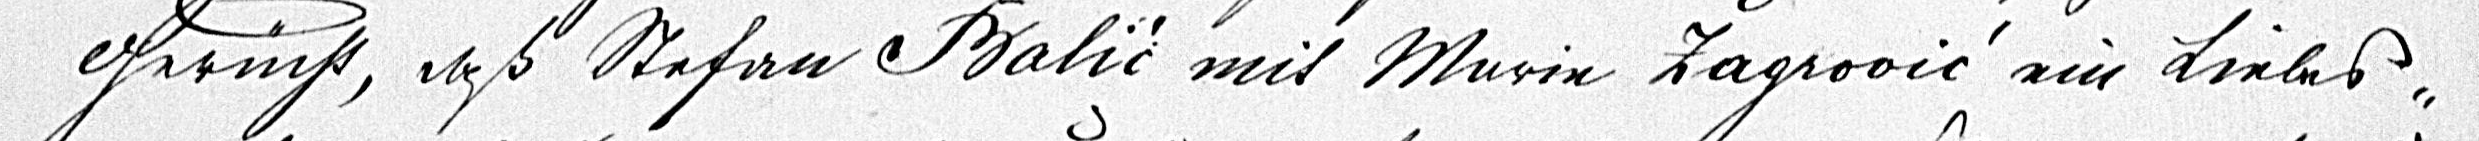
Gericht, daß Stefan Balić mit Marie Zagrović ein Liebes¬
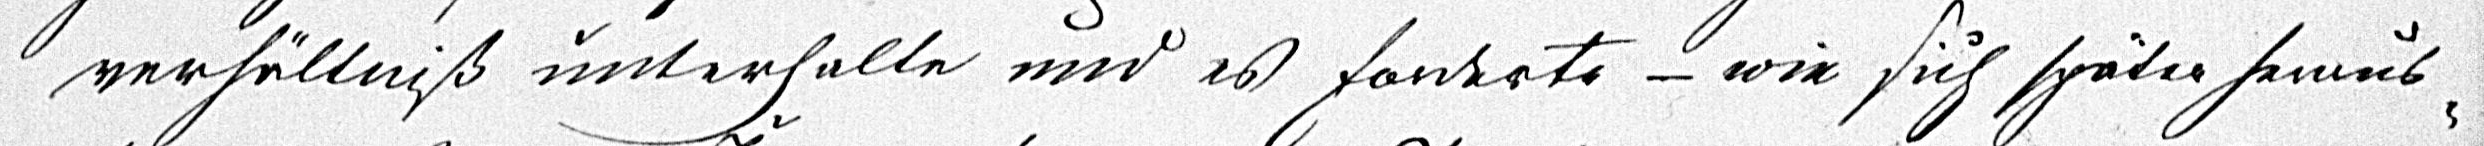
verhältniß unterhalte und es forderte - wie sich später heraus¬
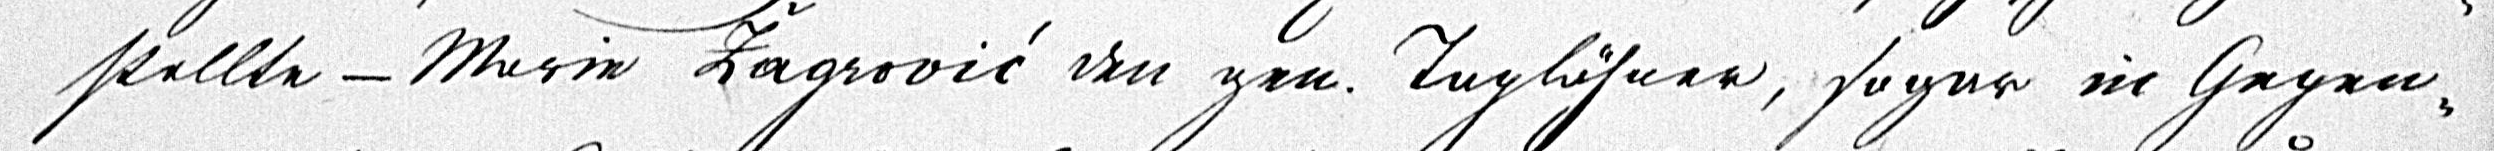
stellte - Marie Zagrović den gen. Taglöhner, sogar in Gegen¬
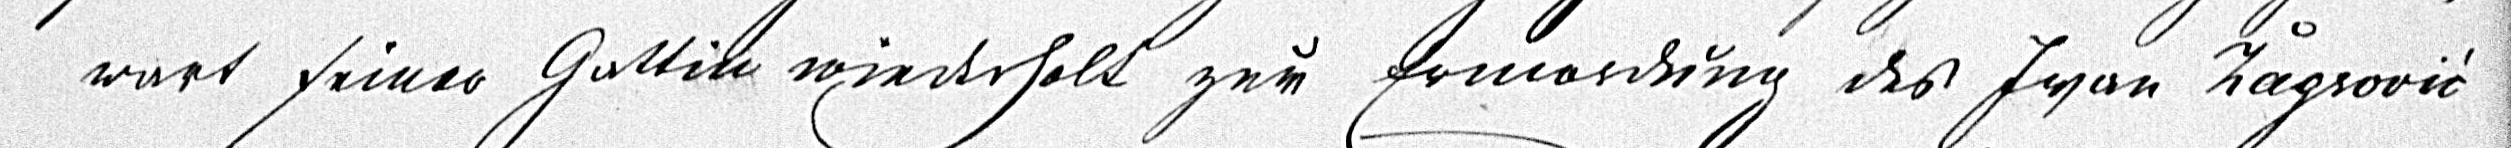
wart seiner Gattin wiederholt zum Ermordung des Ivan Zagrović
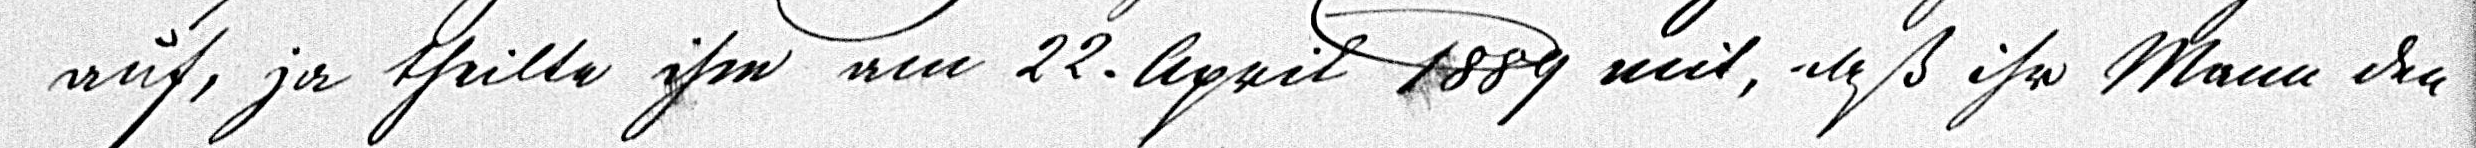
auf, ja theilte ihm am 22. April 1889 mit, daß ihr Mann den
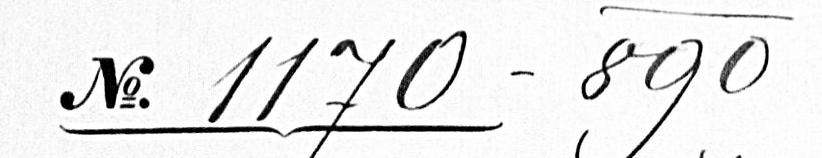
N° 1170 - 890
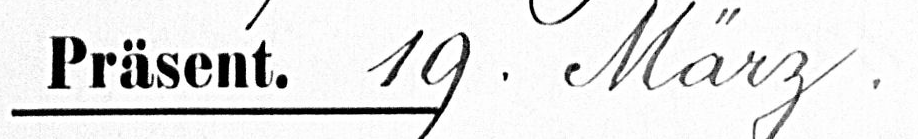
Präsent. 19. März.
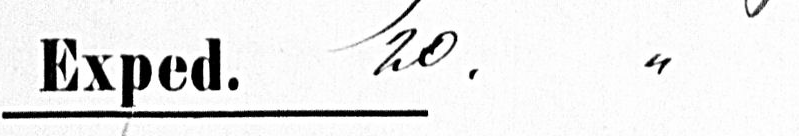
Exped. 20. März.
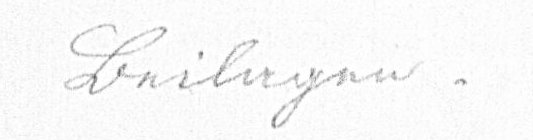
Beilagen.
